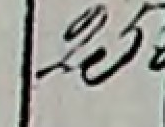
25
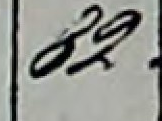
32
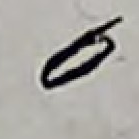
6
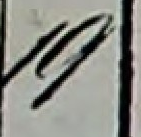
19
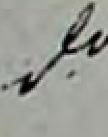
do
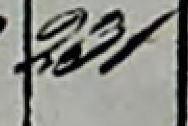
231
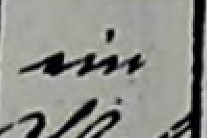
ein
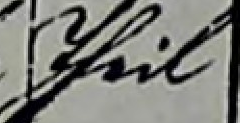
Theil
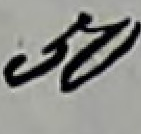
50
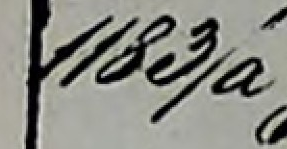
1183/a
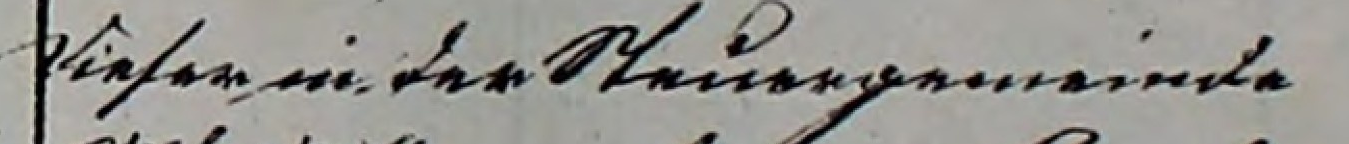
Dieser in der Steuergemeinde
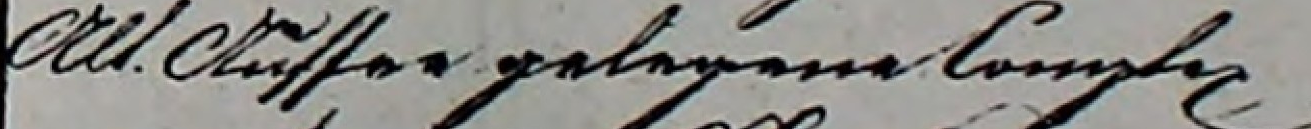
Alt. Aussee gelegene Complex
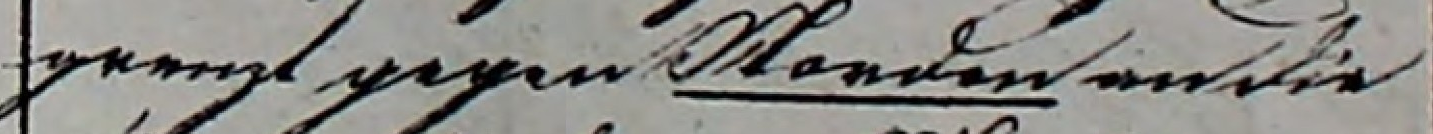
grenzt gegen Norden an die
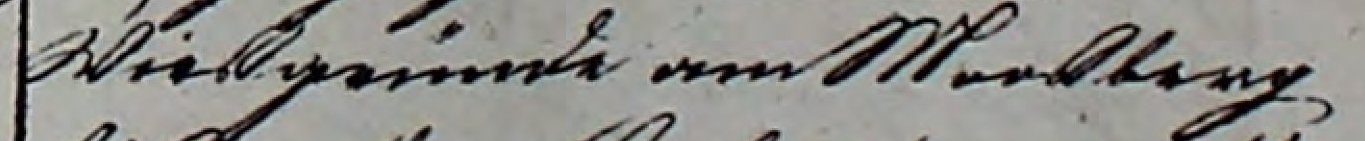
Wies gründe am Marsberg
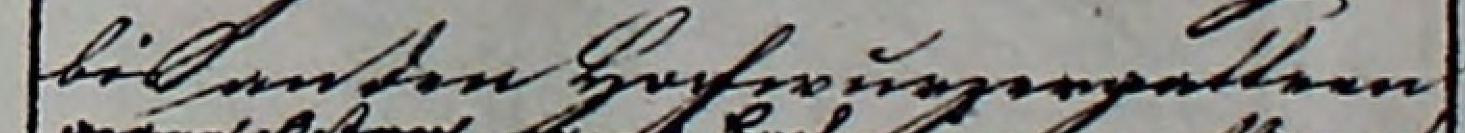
bis an den Hochwurzergattern
